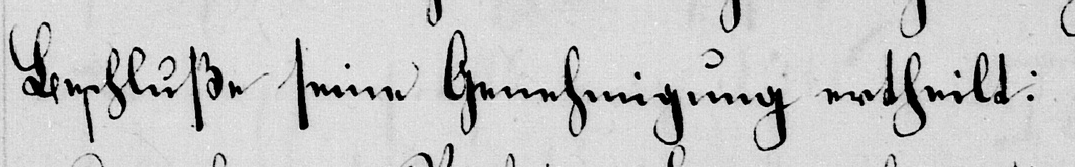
Beschluße seine Genehmigung ertheilt:
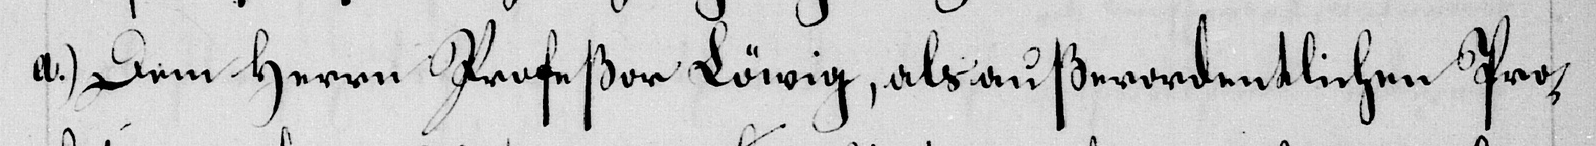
a.) Dem Herrn Profeßor Löwig, als außerordentlichen Pro¬
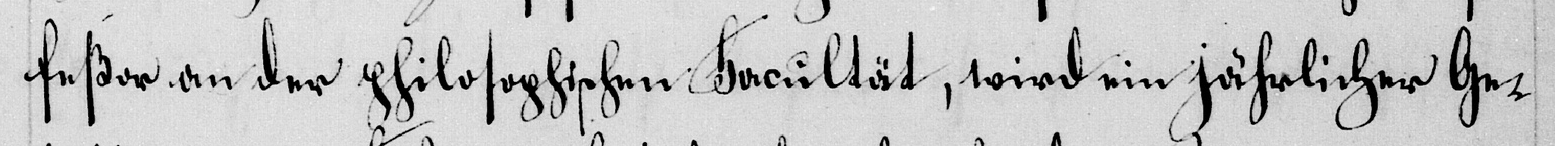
feßor an der philosophischen Facultät, wird ein jährlicher Ge¬
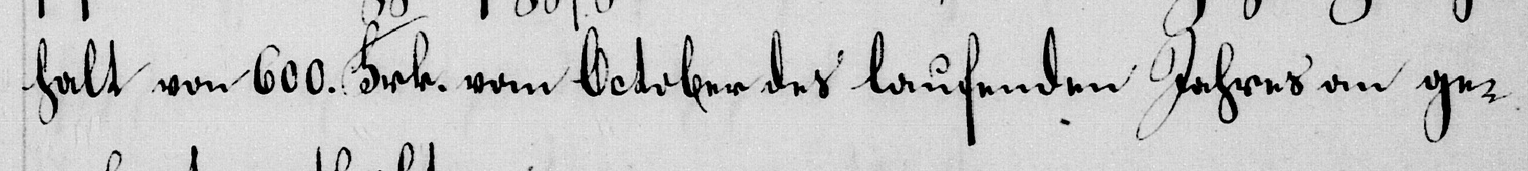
halt von 600. Frk. vom October des laufenden Jahres an ge¬
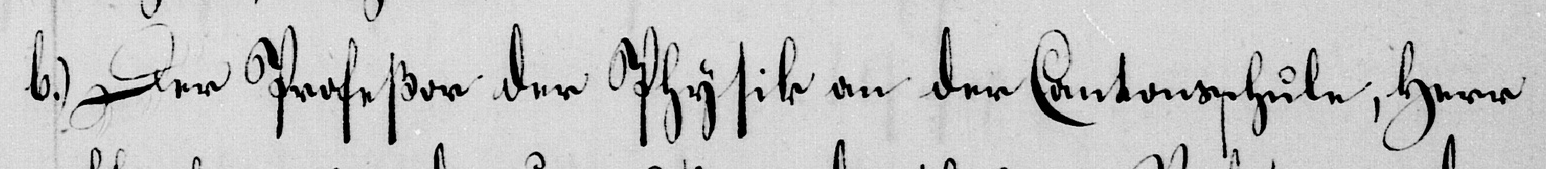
b.) Der Profeßor der Physik an der Cantonsschule, Herr
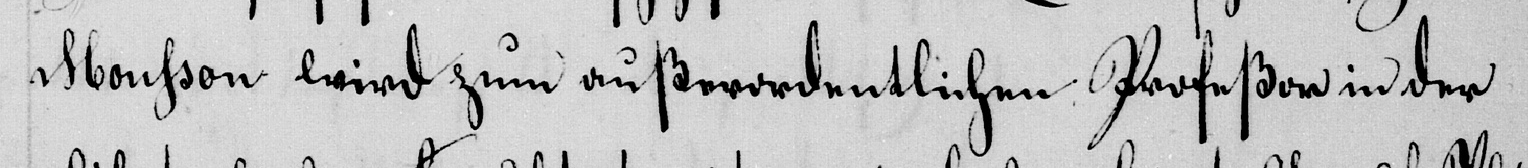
Mouhson wird zum außerordentlichen Profeßor in der
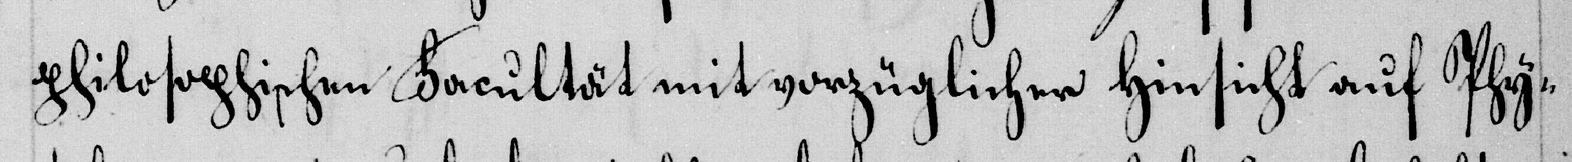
philosophischen Facultät mit vorzüglicher Hinsicht auf Phys¬
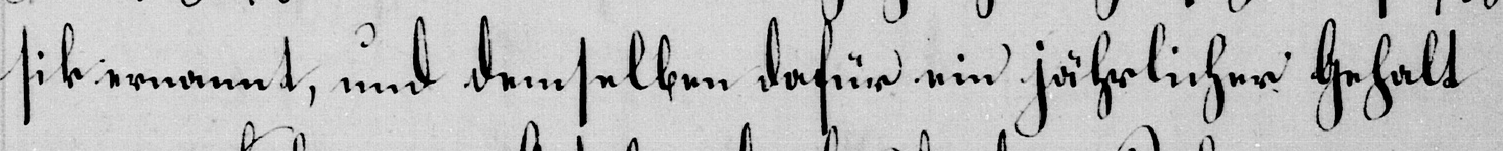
ik ernannt, und demselben dafür ein jährlicher Gehalt
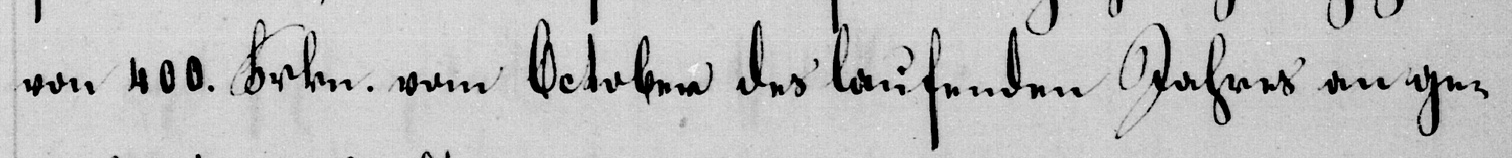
von 400. Frkn. von October des laufenden Jahres an ge¬
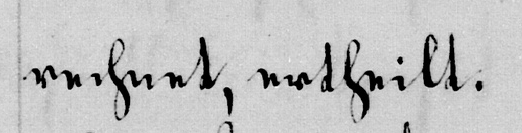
rechnet, ertheilt.
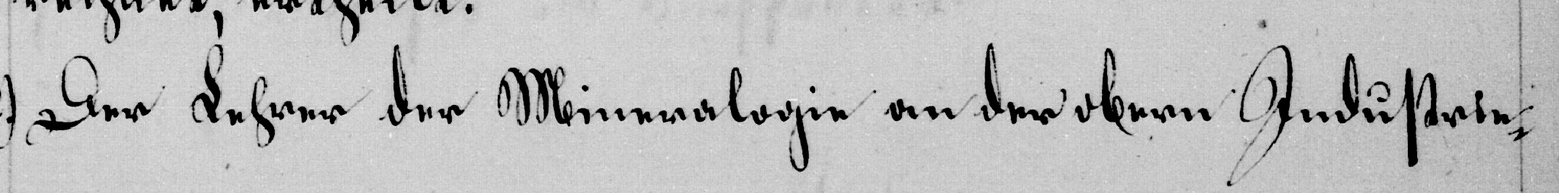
Der Lehrer der Mineralogie an der obern Industrie-
